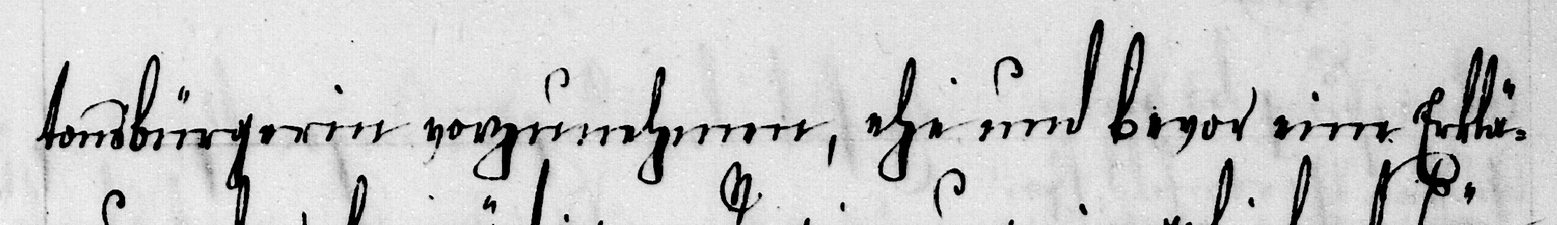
tonsbürgerin vorzunehmen, ehe und bevor eine Erklä¬
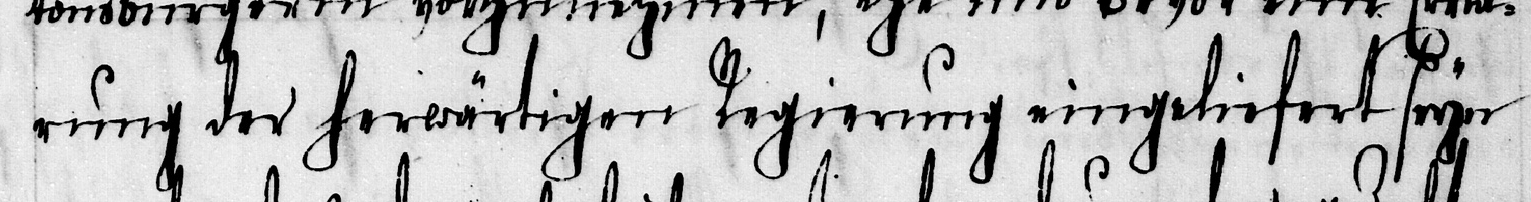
rung der herwärtigen Regierung eingeliefert seyn
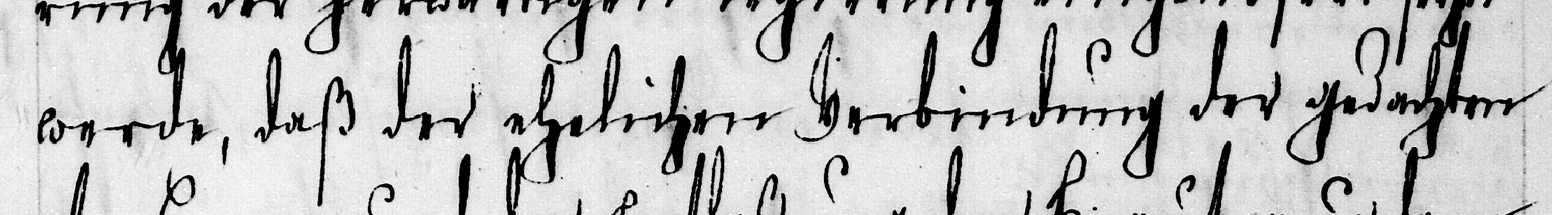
werde, daß der ehelichen Verbindung der gedachten
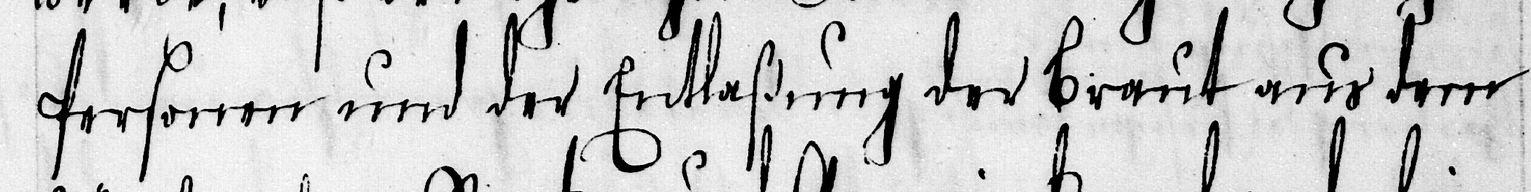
Personen und der Entlaßung der Braut aus dem
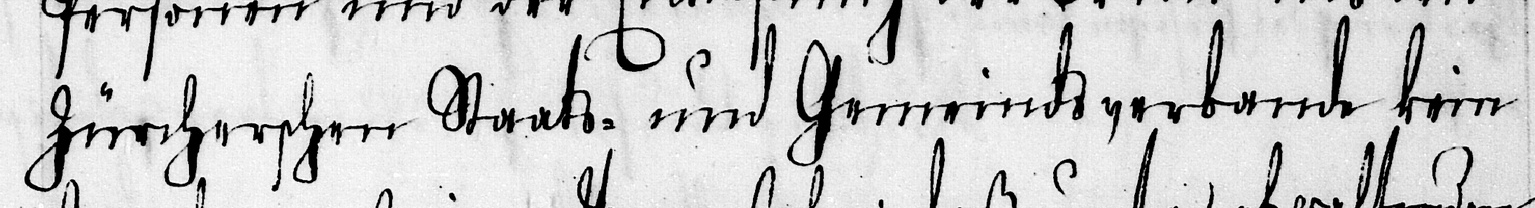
Zürcherschen Staats- und Gemeindsverbande kein
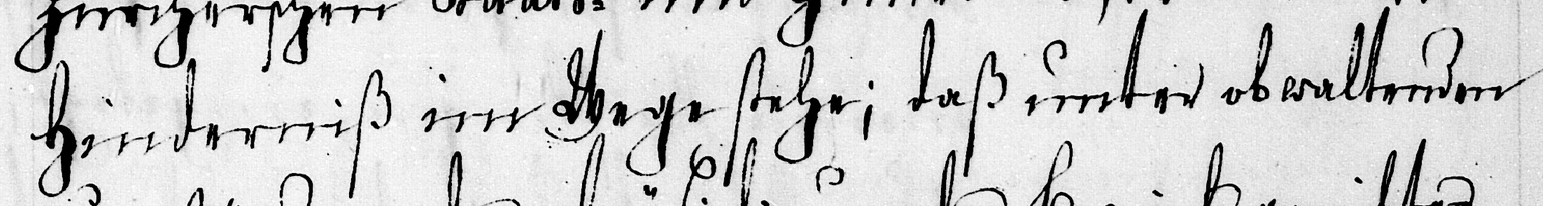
Hinderniß im Wege stehe; daß unter obwaltenden
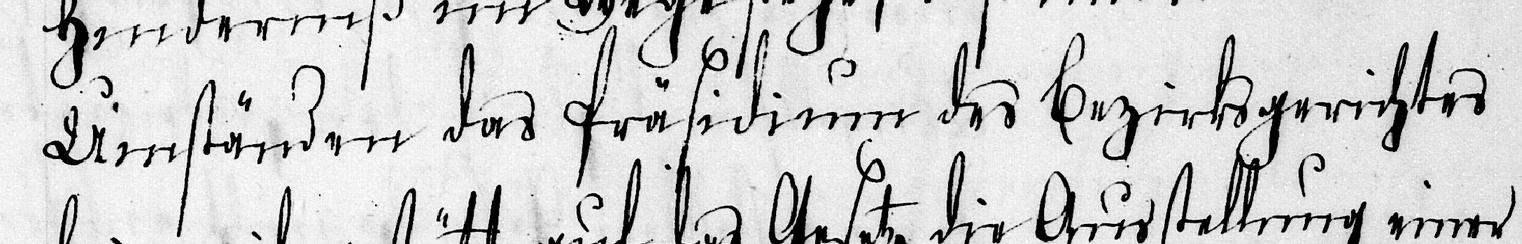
Umständen das Präsidium des Bezirksgerichtes
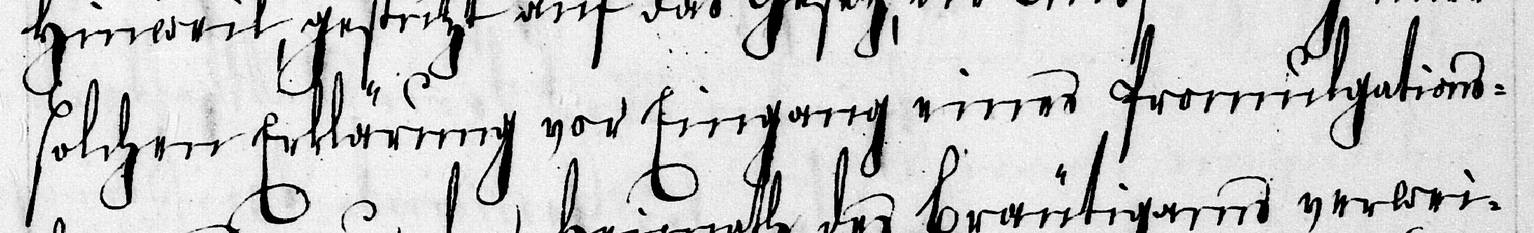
solchen Erklärung vor Eingang eines Promulgations¬
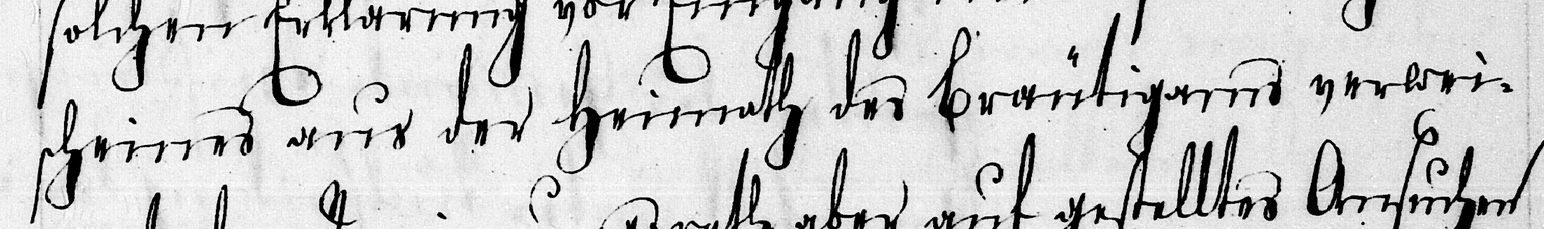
scheines aus der Heimath des Bräutigams verwei¬
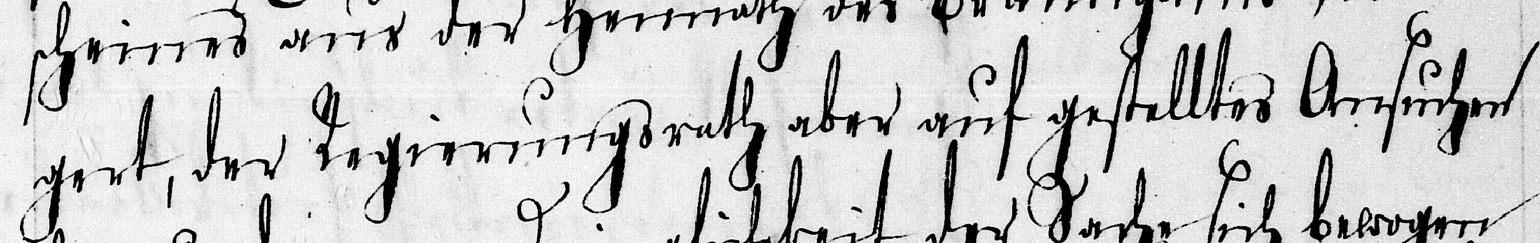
gert, der Regierungsrath aber auf gestelltes Ansuchen
